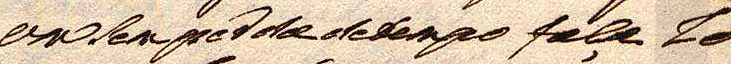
vm sem perda de tempo faÇa lo
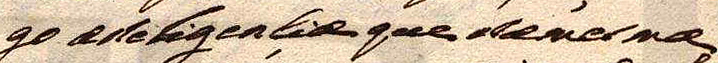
go a deligenÇia que da mesma
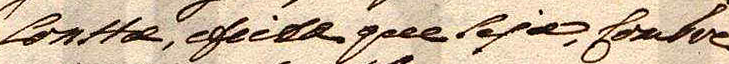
Consta, e feita que seja, Com bre
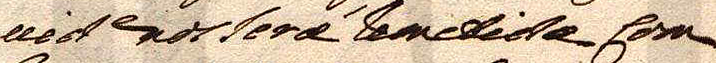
vide nos será Remetida Com
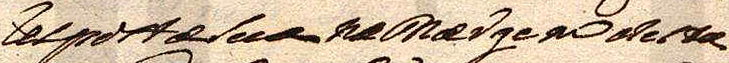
Resposta sua na margem desta
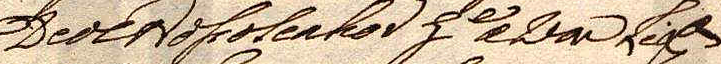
Deoz Nosso senhor Ge a vm Lixa
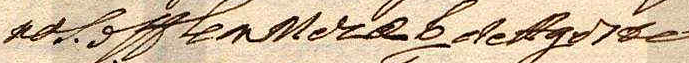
no s. off.o em meza 6 de Agosto
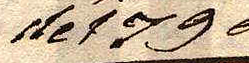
de i790
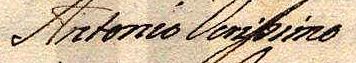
Antonio Verissimo
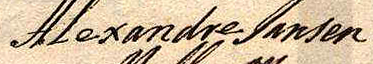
Alexandre Iansen
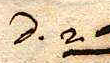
d.20
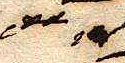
cta 2_
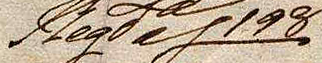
Regd.ta a f i98
